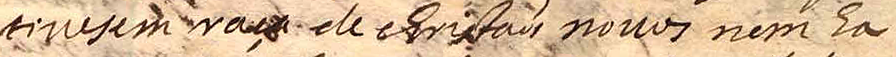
tiuesem raça de christaõs nouos nem ha
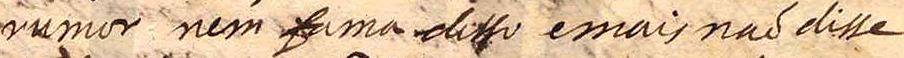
rumor nem fama disso e mais naõ disse
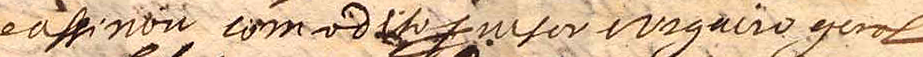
e assinou com o dito ꝓuisor e vigairo geraL
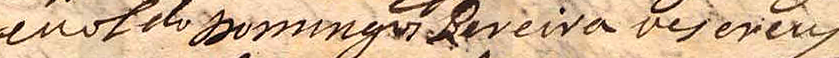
eu o Ldo Domingos Pereira o escreuj
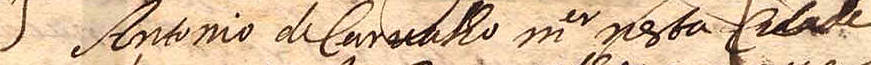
Ta Antonio de Carualho mor nesta Cidade
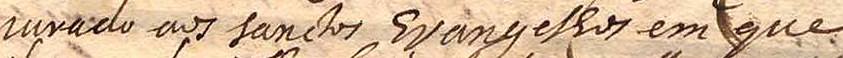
iurado aos sanctos Evangelhos em que
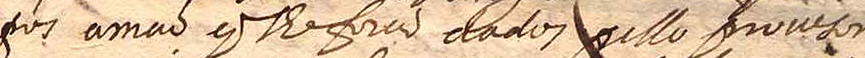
pōs a maõ q̄ lhe foraõ dados pello prouisor
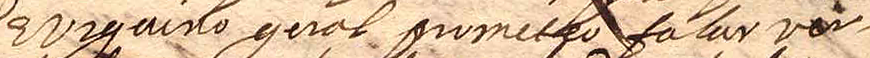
E Vigairo geral prometeo falar ver
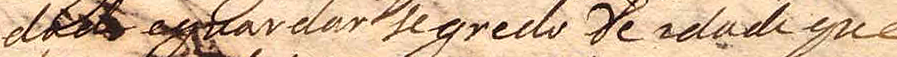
dade e guardar segredo de idade que
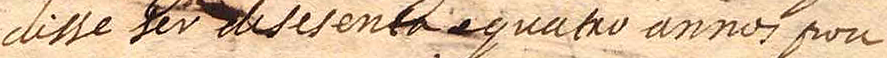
disse ser de sesenta e quatro annos pou
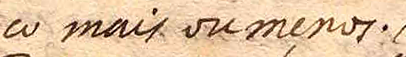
co mais ou menos.
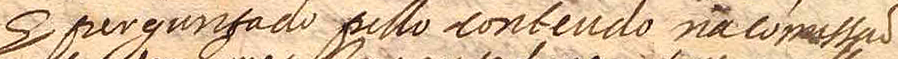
E perguntado pello conteudo na cōmissaõ
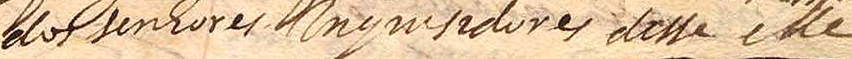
dos senhores Inquisidores disse elle
